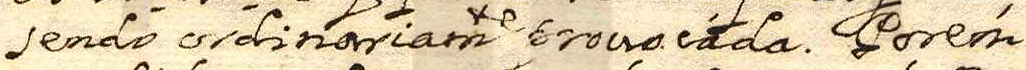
sendo ordinariamte prouocada. Porem
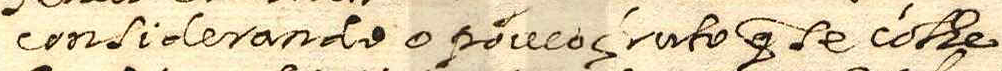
considerando o pouco fruto q̄ se colhe
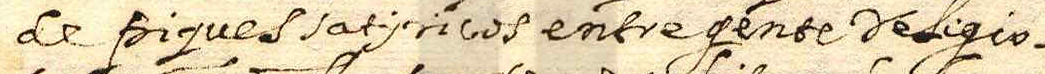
de piques satyricos entre gente religio
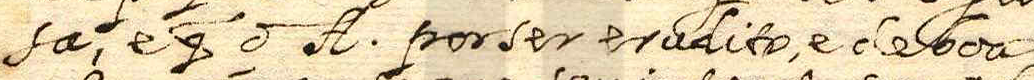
sa, e q̄ o A. por ser erudito, e de boa
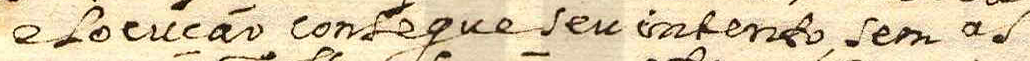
elocução consegue seu intento, sem as
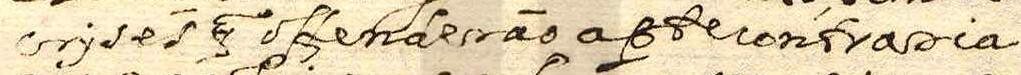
cryses q̄ offenderão a pte contraria
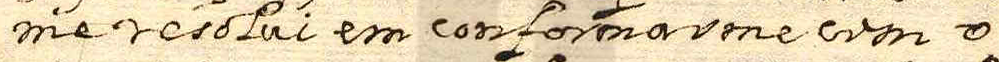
me resolui em conformarme com o
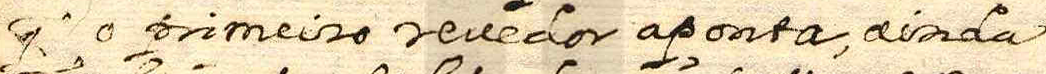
q̄ o primeiro reuedor aponta, ainda
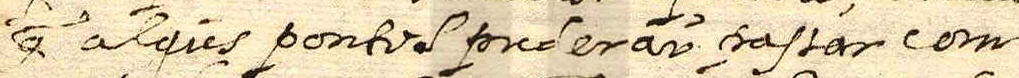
q̄ algūs pontos puderaõ passar com
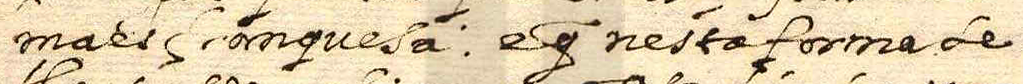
maes franquesa: e q̄ nesta forma se
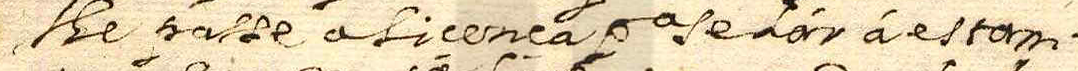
lhe passe a Licença pa se dar á estam
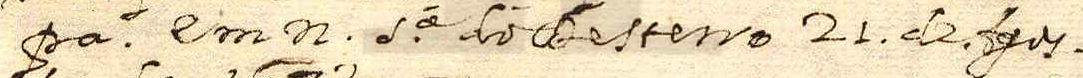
pa. em n. s.a do Desterro 21. de Agos
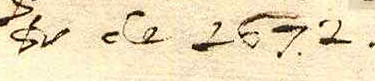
to de 1672.
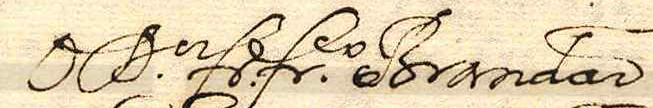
O D.or fr. fr.co Brandaõ
